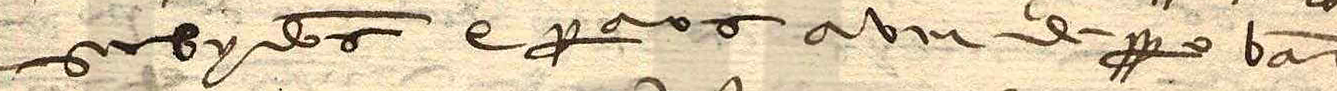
sebydos e ꝑa os aver de ꝓꝓovar
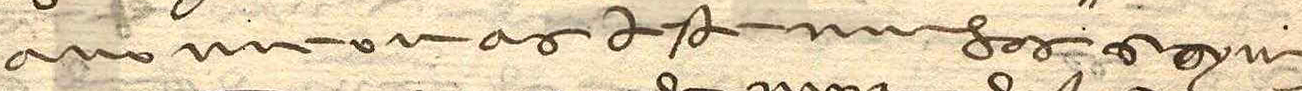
anomeou as testemunhas segym
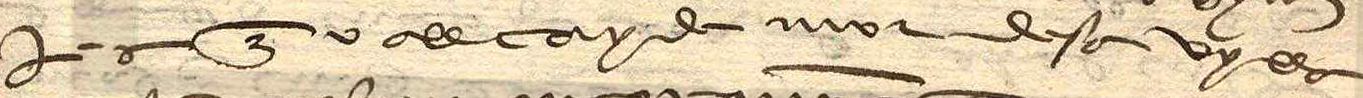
tes item o allcayde mor desa vylla
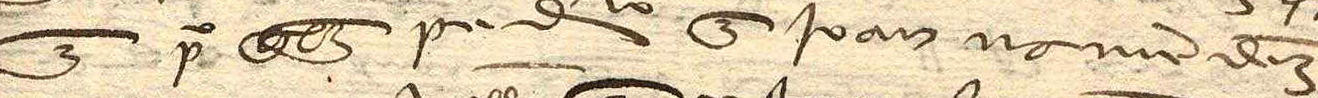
item po ḡlz pedro item Joanna mēdez
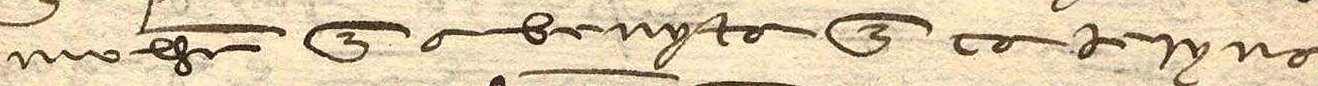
molher item a benyta item cateryna
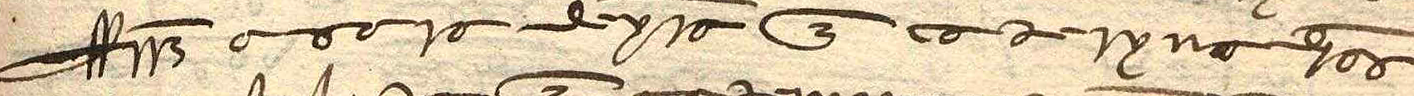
ffr̄rz a saradeyra item cateryna djas
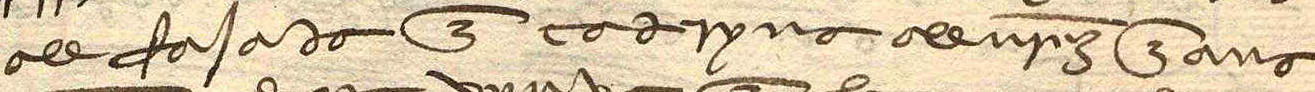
allfaJata item cateryna allūrez item ana
